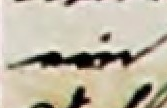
ein
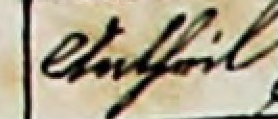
Antheil
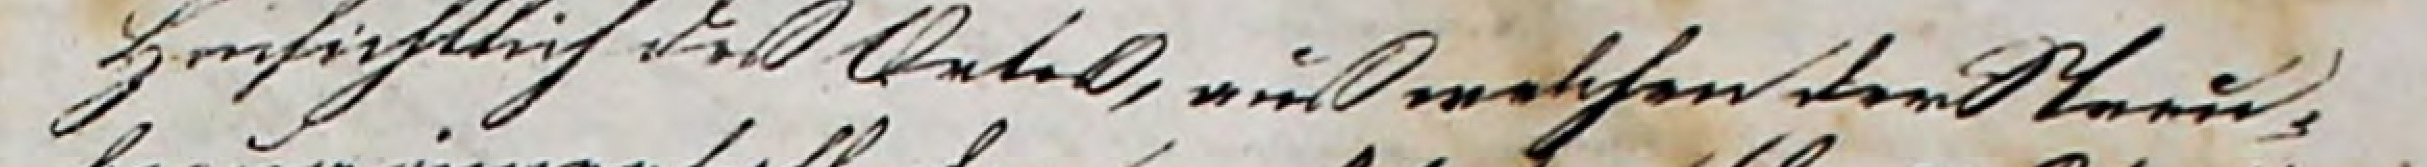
Hinsichtlich des Ortes, aus welchen der Streu„
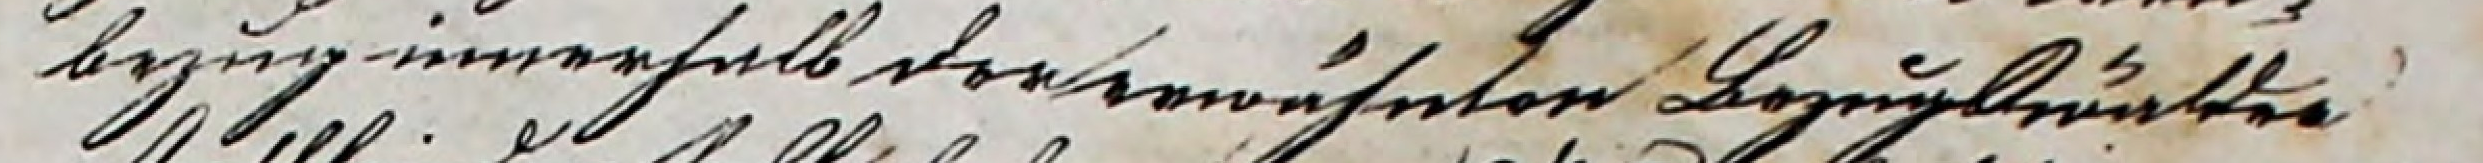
bezug innerhalb der erwähnten Bezugswälder
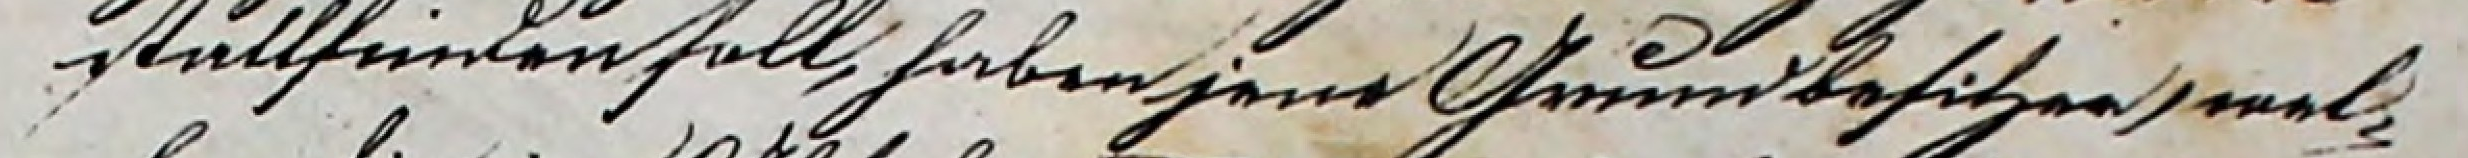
Rattfinden soll, haben jene Grundbesitzer, wel„
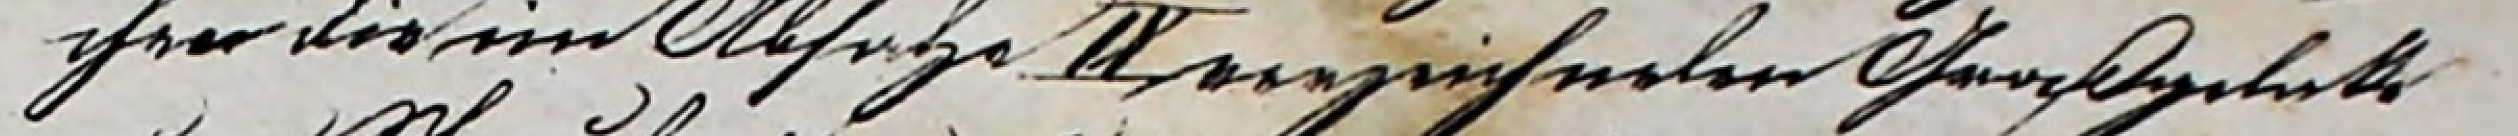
chen die im Absatze IX verzeichneten Großgelak
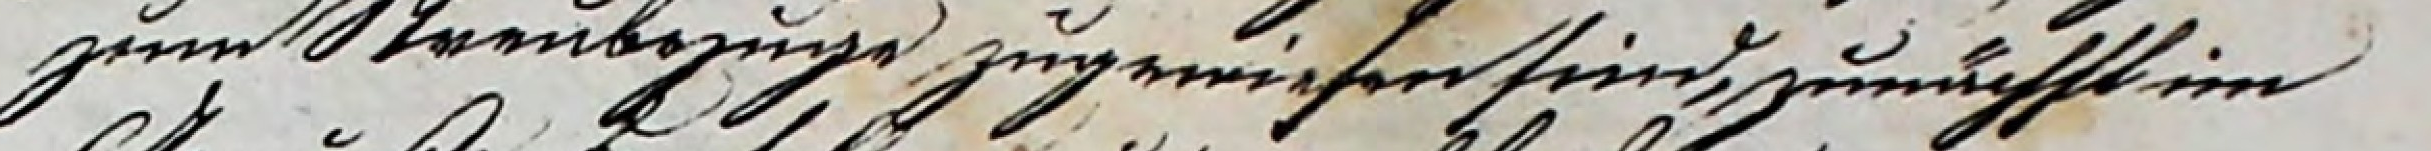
zum Streubezuge, zugewiesen sind, zunächst im
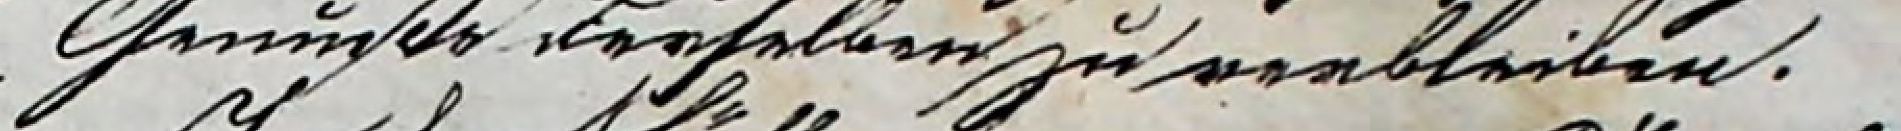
Genuße derselben zu verbleiben.
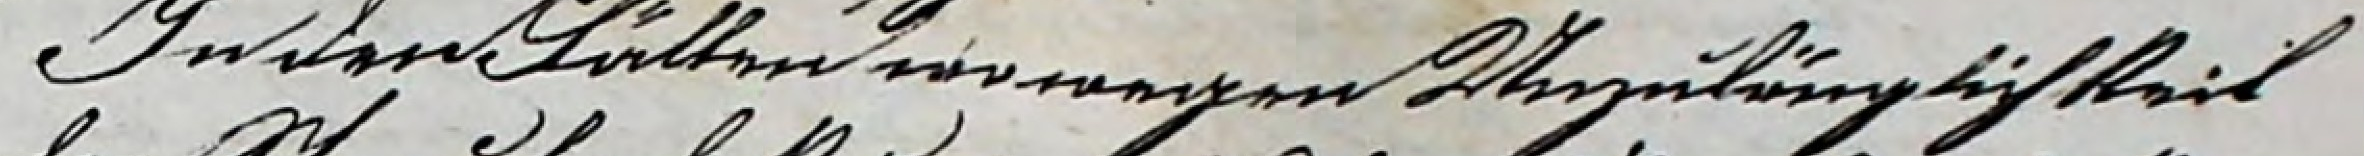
In den Fällen ??? wegen Unzu???lich Reit
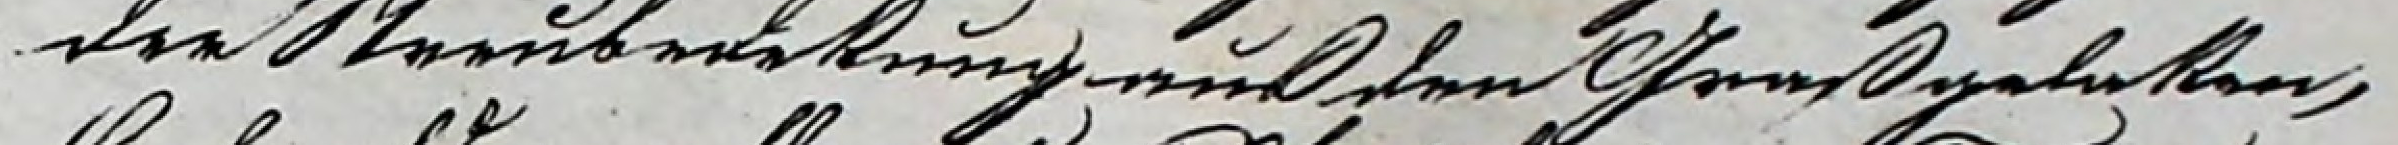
der Streubedekung aus den Graßgelaken,
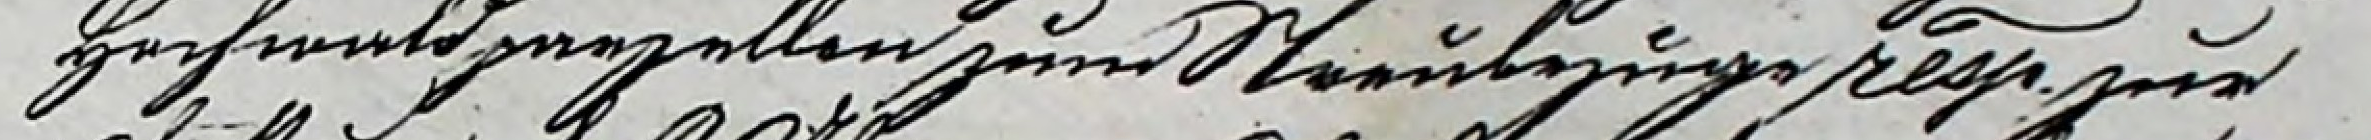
Hochwaldparzellen zum Streubezuge resp. zur
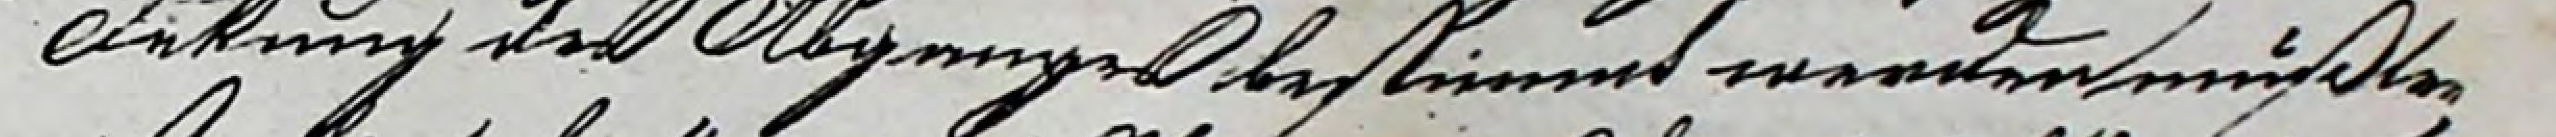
Dekung des Abganges bestimmt werden müßten
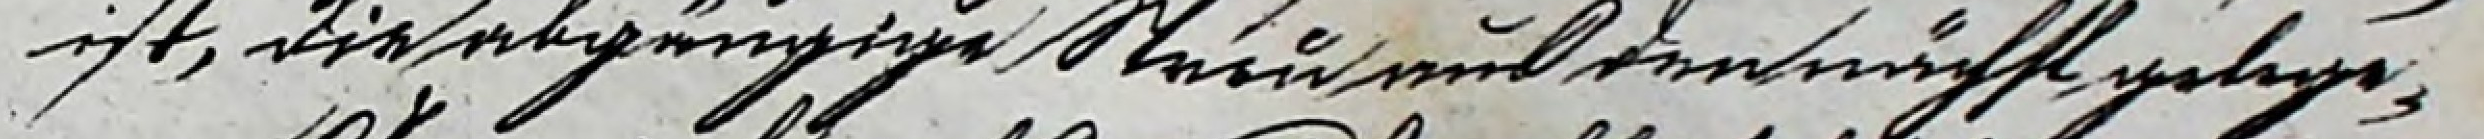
ist, die abgängige Streu aus den nächst, gelege„
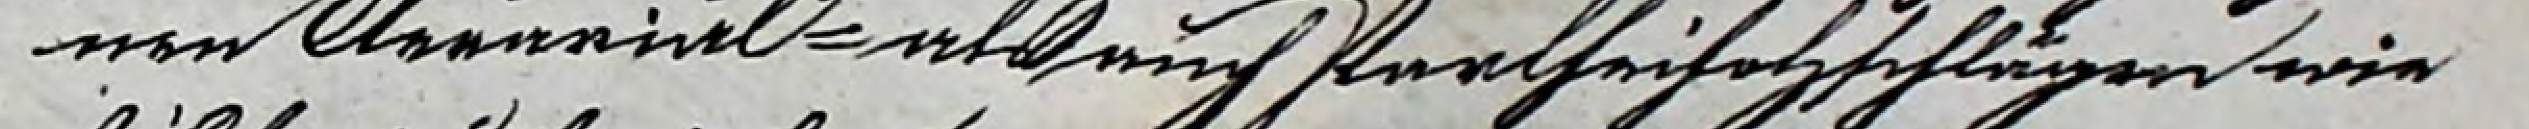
nen Aerarial-als auch Partheiholzschlägen wie
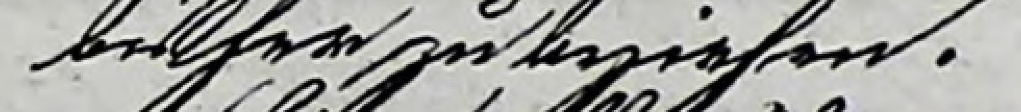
bisher zu beziehen.
